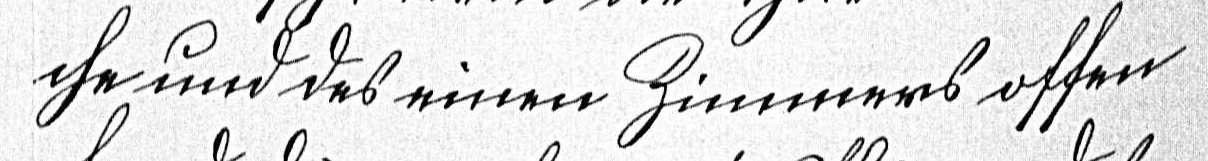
che und des einen Zimmers offen
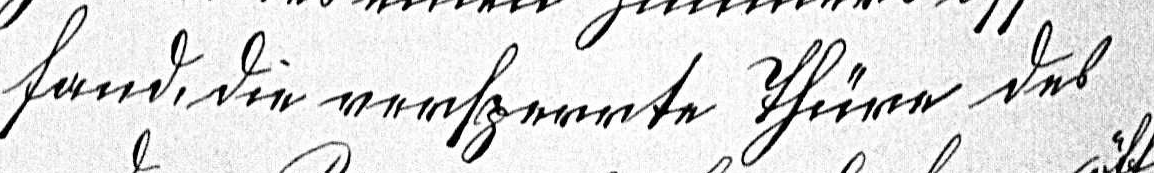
fand, die versperrte Thüre des
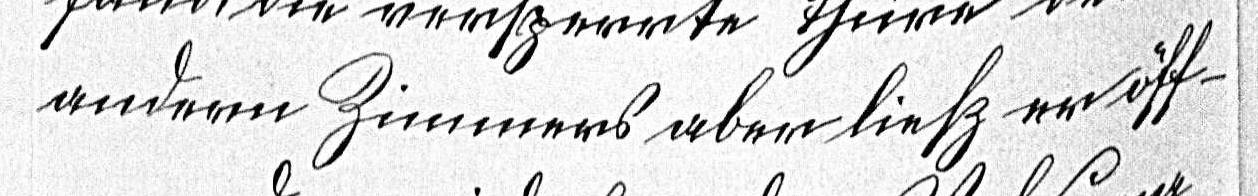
anderen Zimmers aber ließ eröff¬
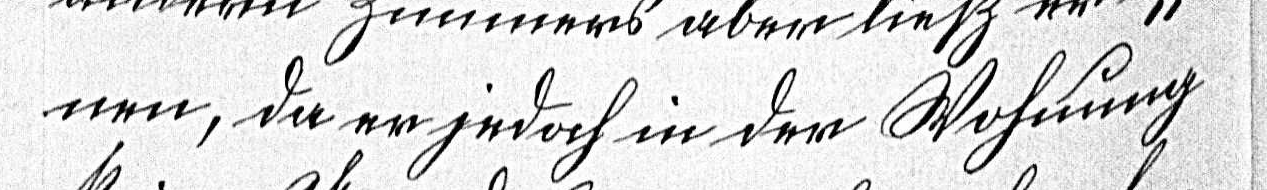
nen, da er jedoch in der Wohnung
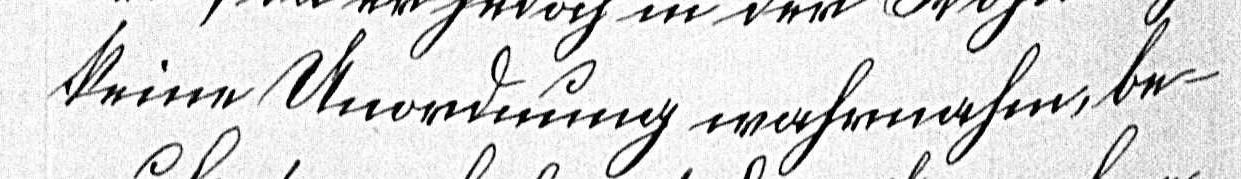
keine Anordnung wahrnahm, be¬
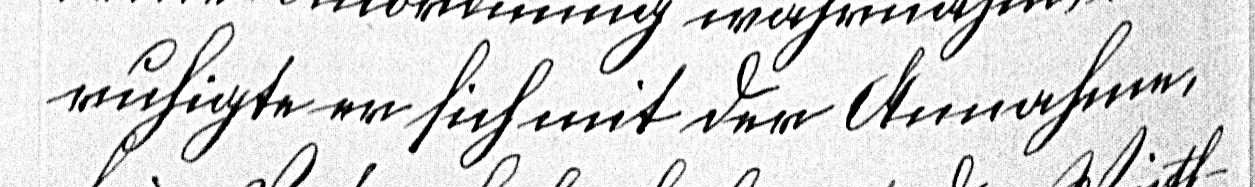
ruhigte er sich mit der Annahme,
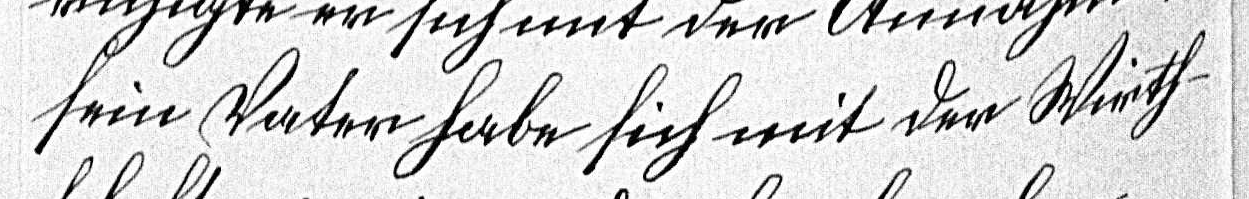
sein Vater habe sich mit der Wirth¬
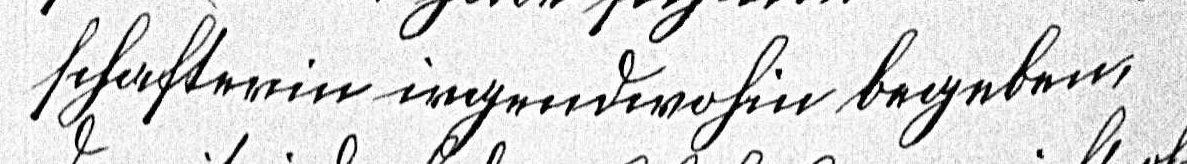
schafterin irgendwohin begeben,
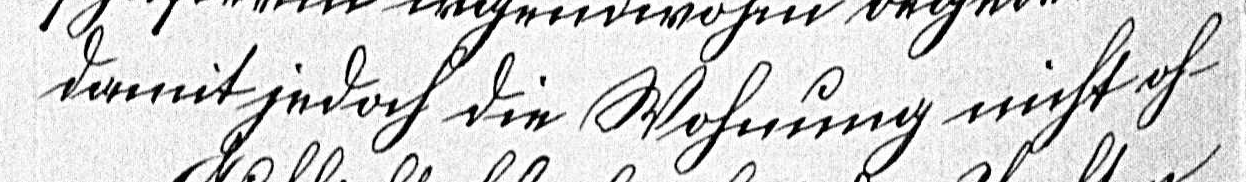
damit jedoch die Wohnung nicht oh¬
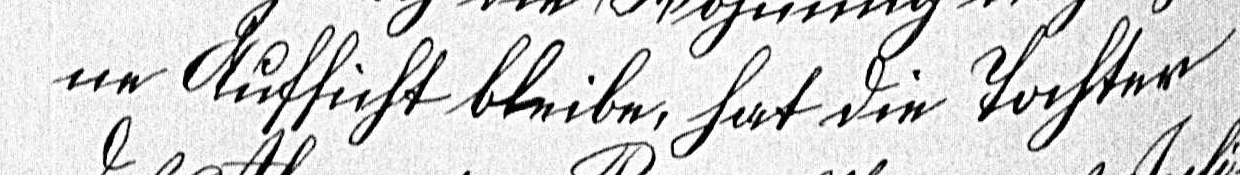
ne Aufsicht bleibe, hat die Tochter
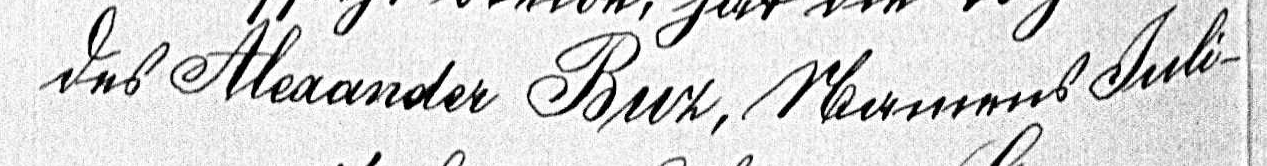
des Alexander Buz, Namens Juli¬
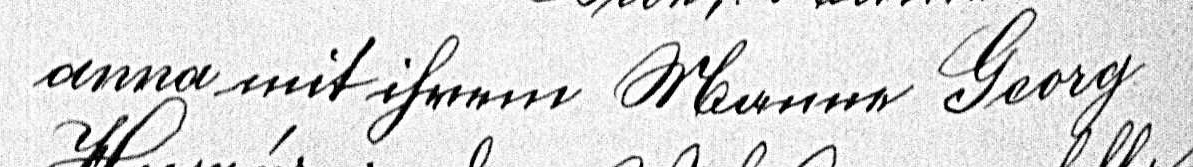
anna mit ihrem Manne Georg
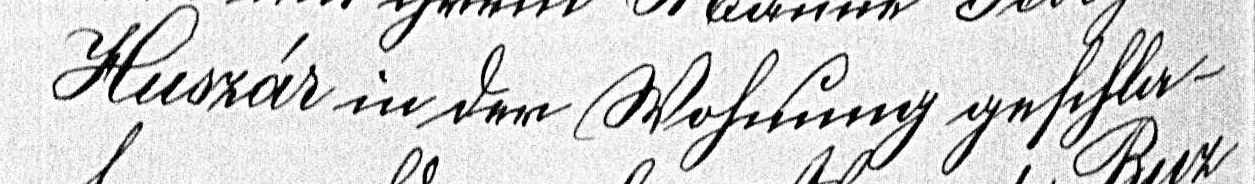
Huszár in der Wohnung geschla¬
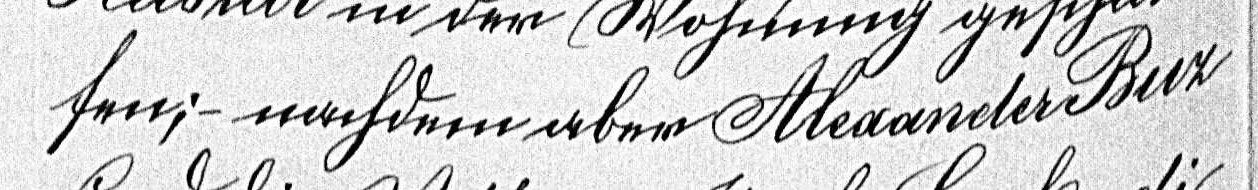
fen; nachdem aber Alexander Buz
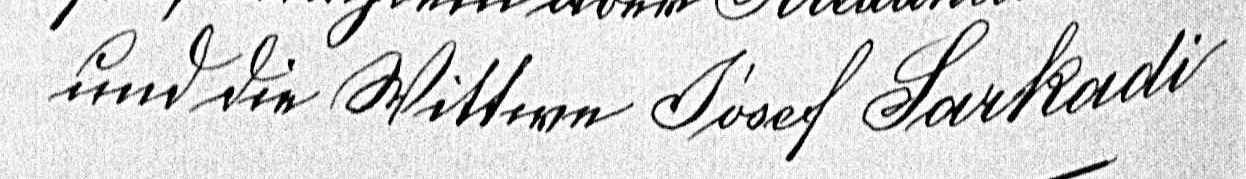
und die Wittwe Jósef Sarkadi
